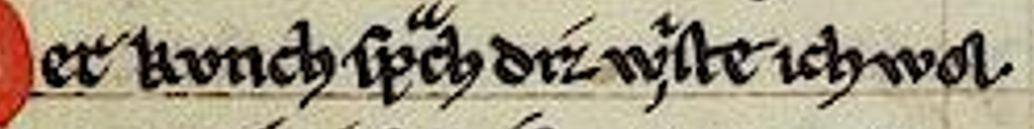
*Der kvnch ſp(ra)ch diz w°(i)ſte ich wol.
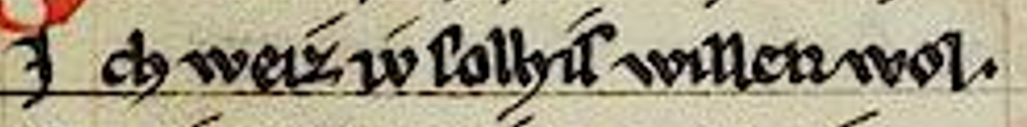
Ich weiz iv ſolhiſ willen wol.
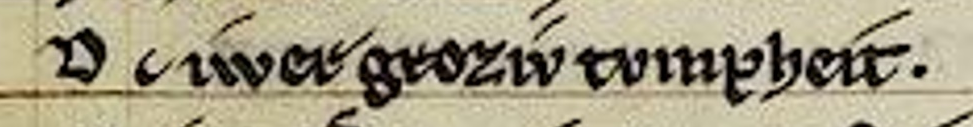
D(az) iwer groziv tvmpheit.
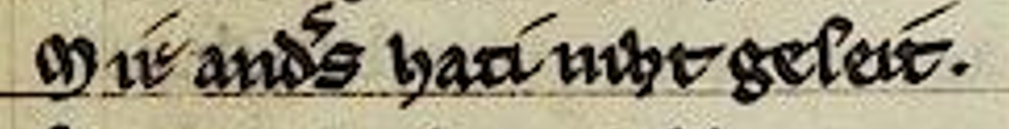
Mir and(er)s hati niht geſeit.
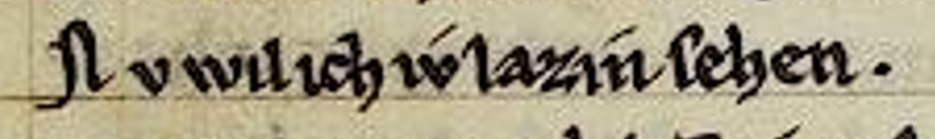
Nv wil ich iv lazin ſehen.
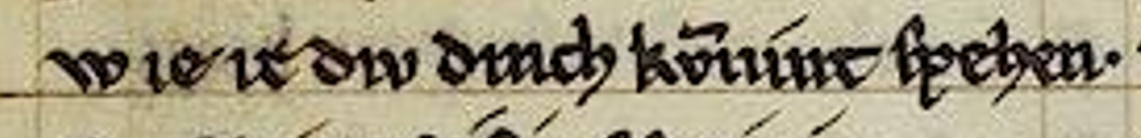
Wie ir div dinch kv(n)nint ſpehen.
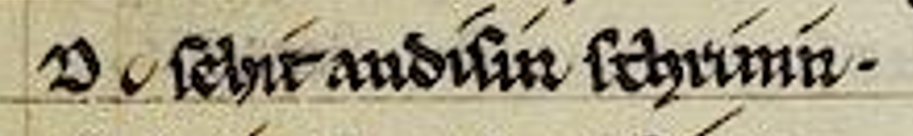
D(az) ſehit andiſin ſchrinin.
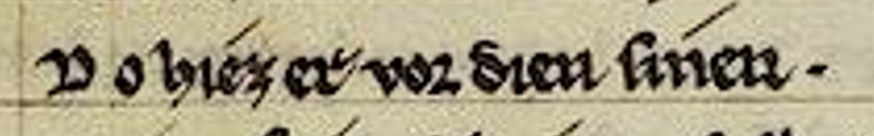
Do hiez er vor dien ſinen.
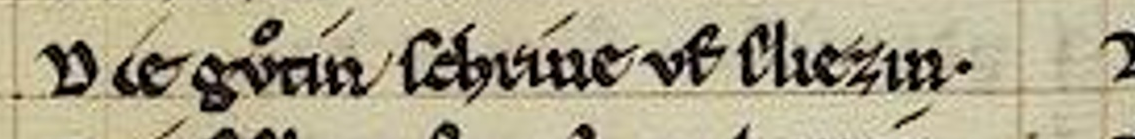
Die gv°otin ſchrine vf ſliezin.
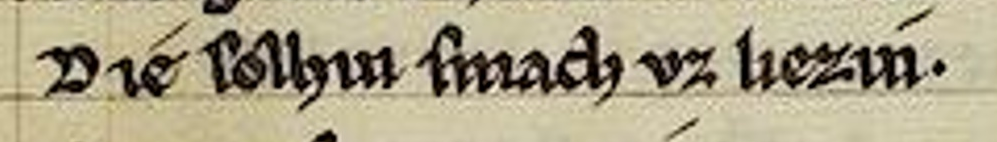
Die ſolhin ſmach vz liezin.
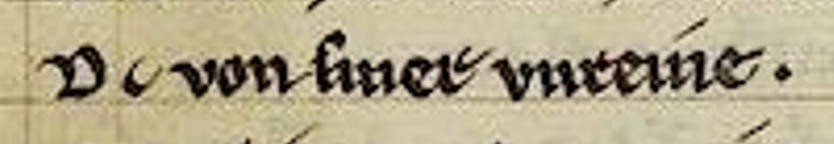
D(az) von ſiner vnreine.
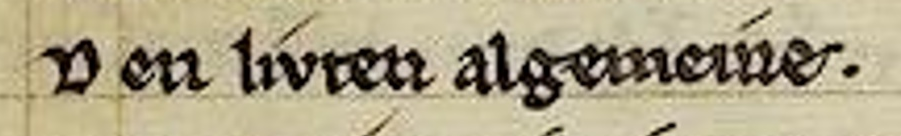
Den livten algemeine.
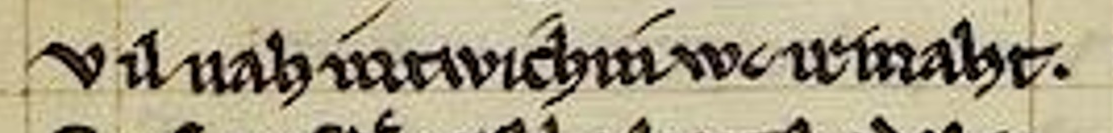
Vil nah intwichin w(az) irmaht.
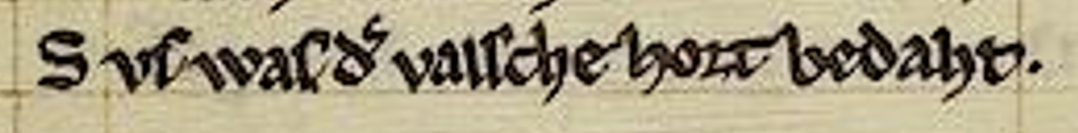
Svſ waſ d(er) valſche hort bedaht.
